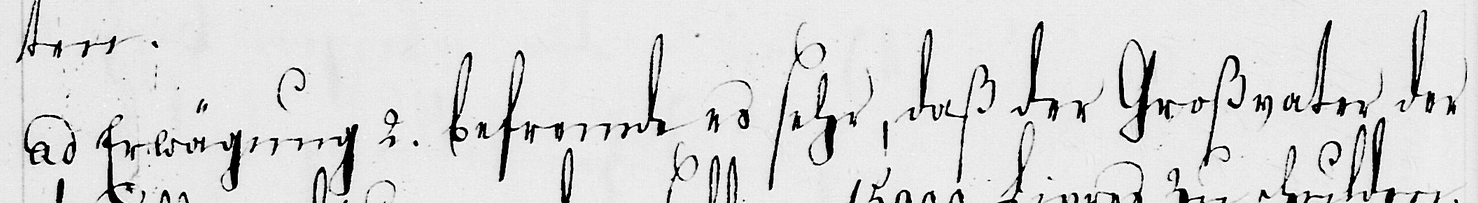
ad Erwägung 2. befremde es sehr, daß der Großvater der
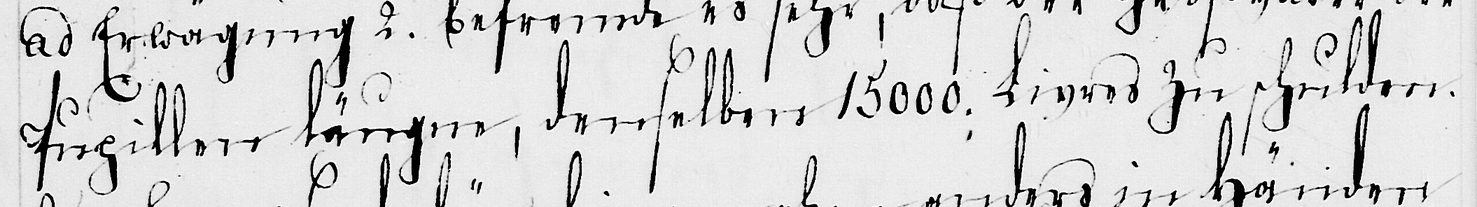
Pupillen läugne, denselben 15000. Livres zu schulden.
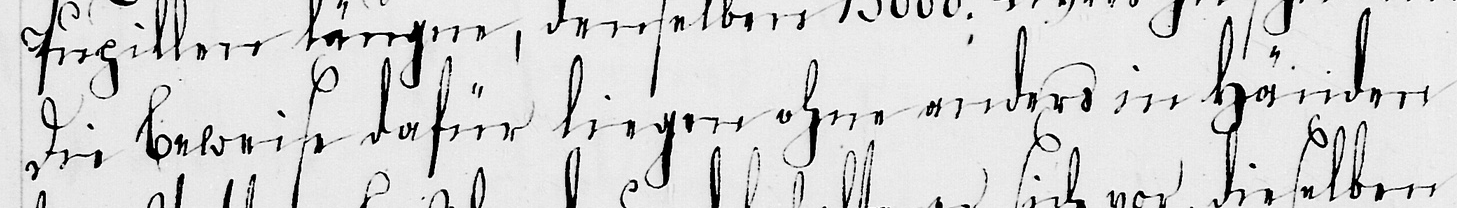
Die Beweise dafür liegen ohne anders in Händen
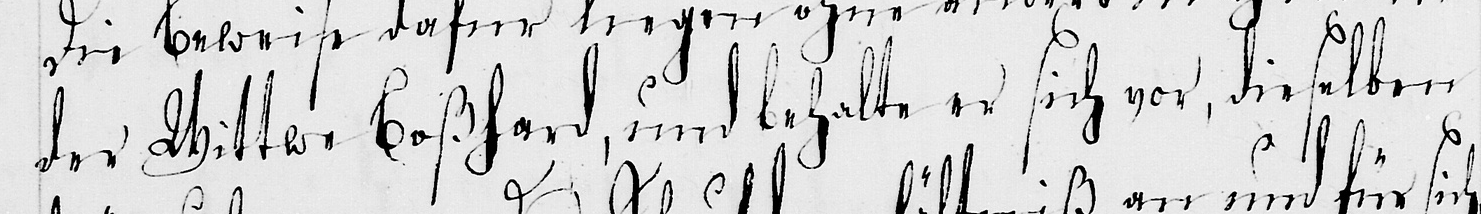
der Wittwe Boßhard, und behalte er sich vor, dieselben
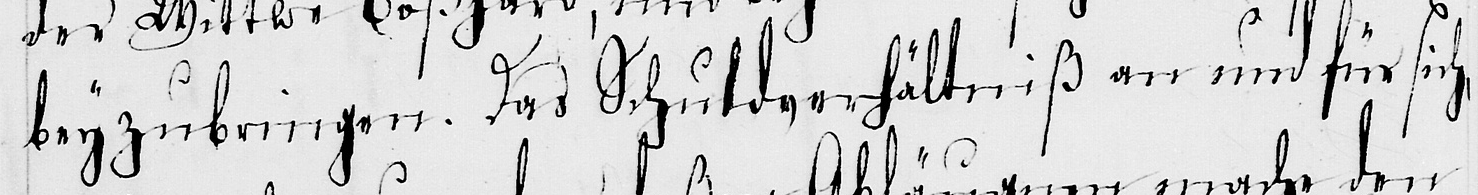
beyzubringen. Das Schuldverhältniß an und für si¬
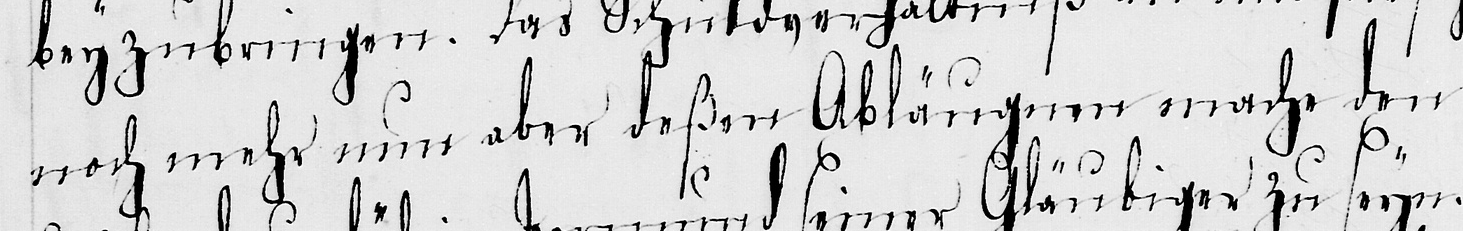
noch mehr nun aber deßen Abläugnen mache den
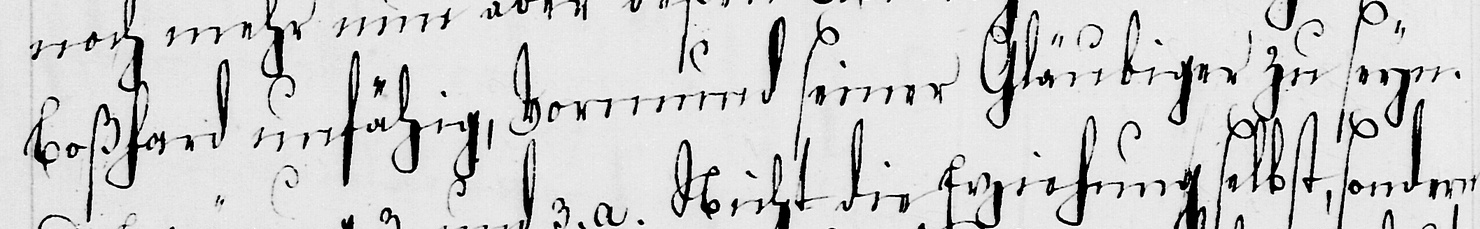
Boßhard unfähig, Vormund seiner Gläubiger zu seyn.
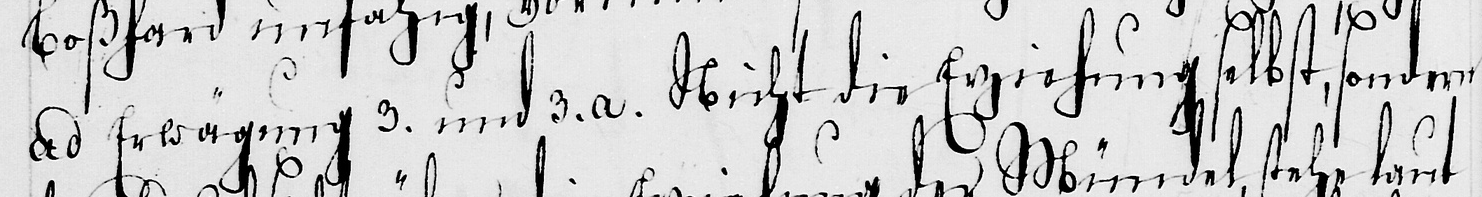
ad Erwägung 3. und 3.a. Nicht die Erziehung selbst, sonde¬
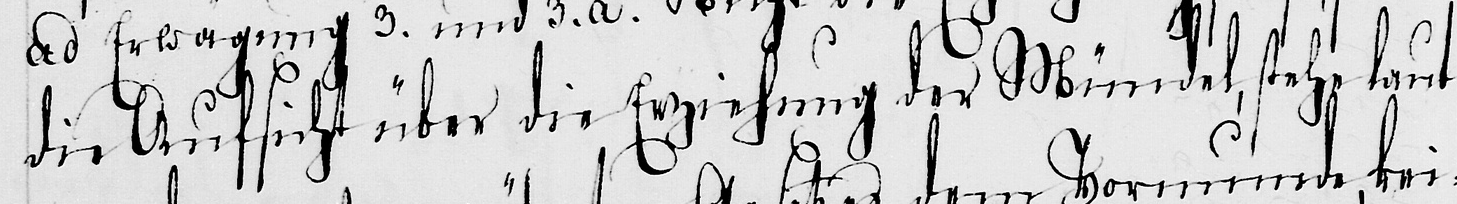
die Aufsicht über die Erziehung der Mündel, stehe laut
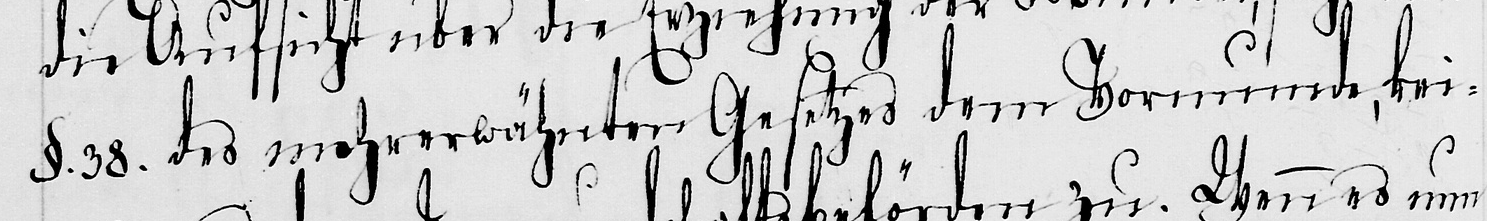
§. 38. des mehrerwähnten Gesetzes dem Vormunde, kei¬
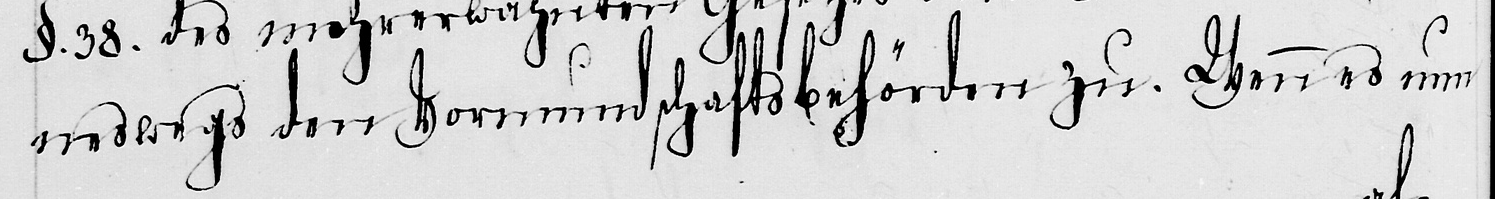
neswegs den Vormundschaftsbehörden zu. Wenn es nun
